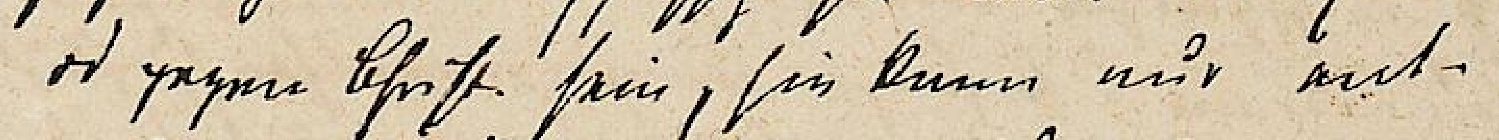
od gegen Christ. sein, sie kann nur ent¬
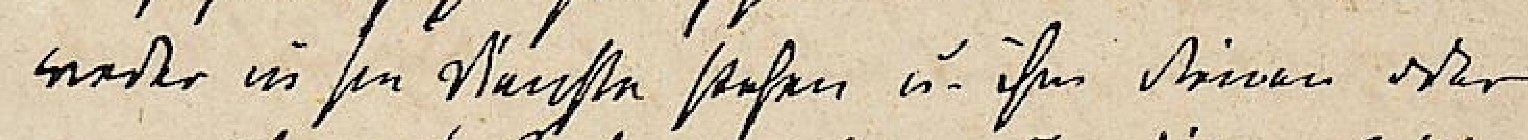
weder in sm Dienste stehen u ihm dienen oder
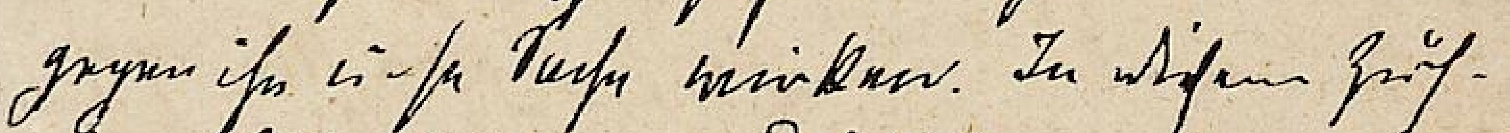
gegen ihn u. sn Sache wirken. In diesem Zus¬
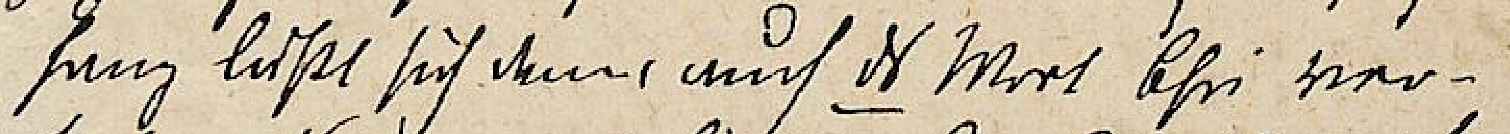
hang läßt sich dann auch ds Wort Chri ver¬
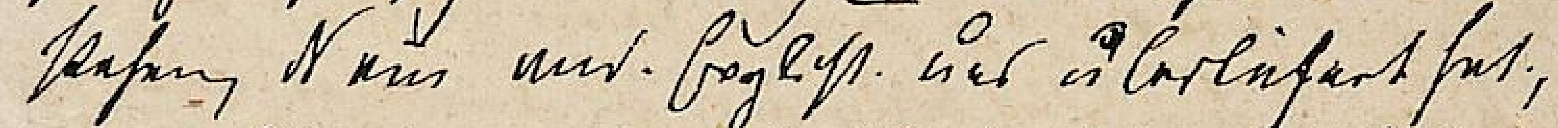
stehen, ds ein and. Evglist uns überliefert hat,
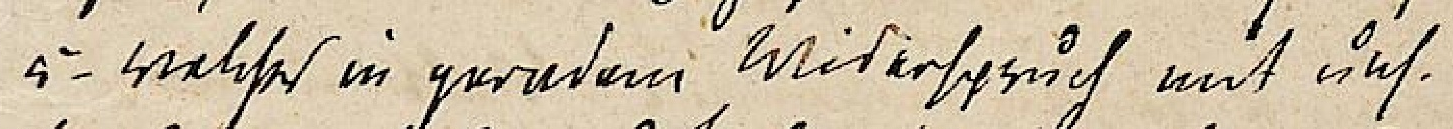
u welches in geradem Widerspruch mit uns.
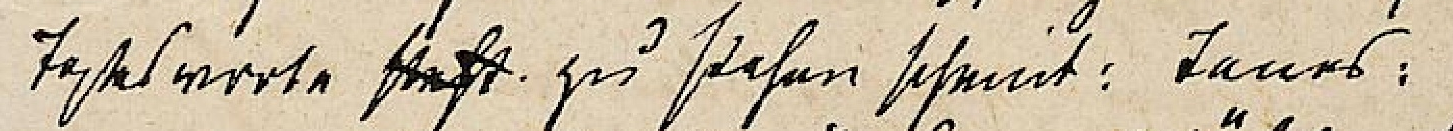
Textesworte steht zu stehen scheint: Jenes:
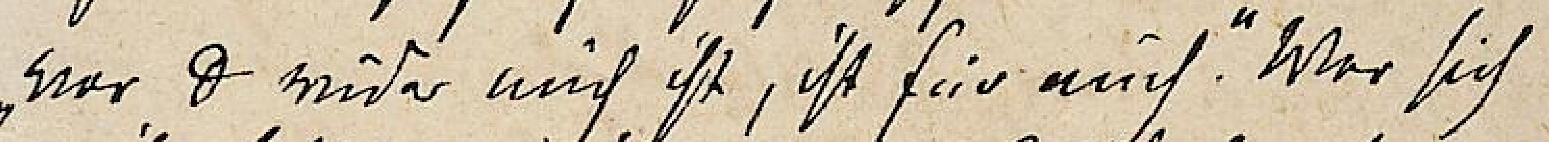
"wer o wider mich ist, ist für mich" Wer sich
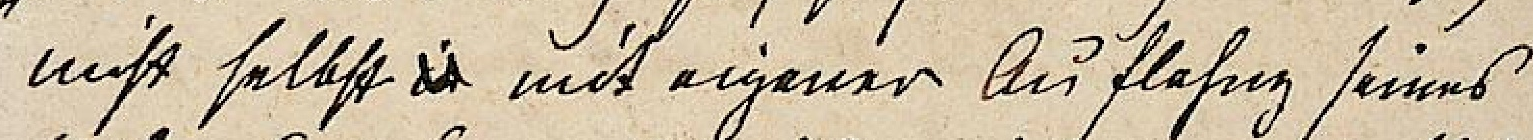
nichts selbst in mit eigener Auflehnung seines
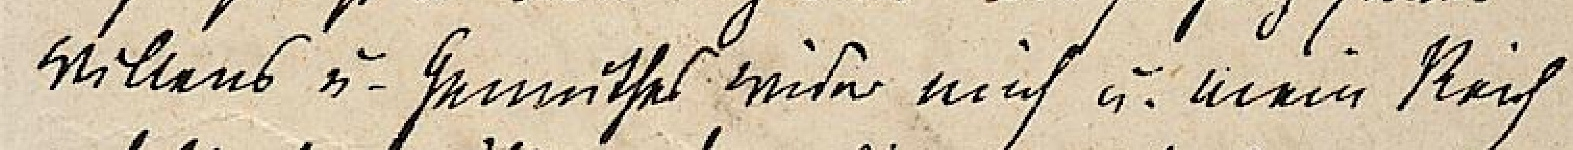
Willens u. Gemüthes wider mich u. mein Reich
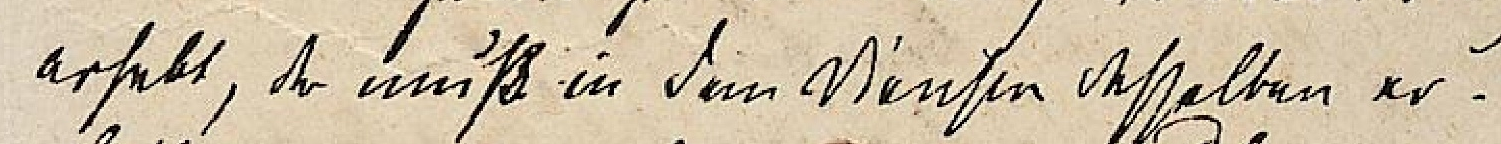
erhebt, der muß in den Dienste desselben ar¬
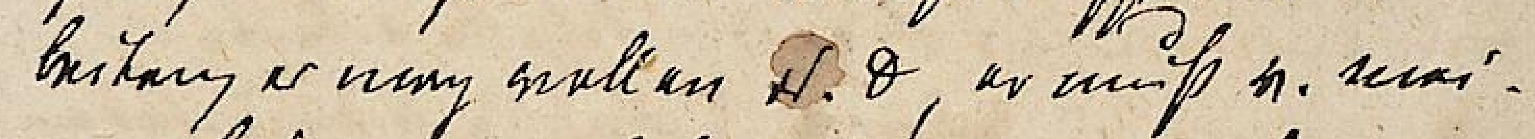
beiten, er mag wollen od. o, er muß v. mei¬
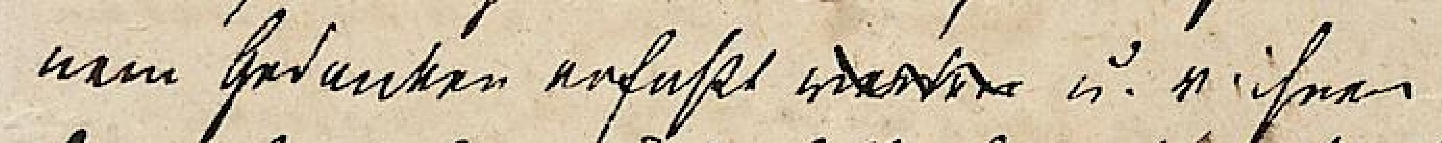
nem Gedanken erfaßt werden u. v. ihnen
